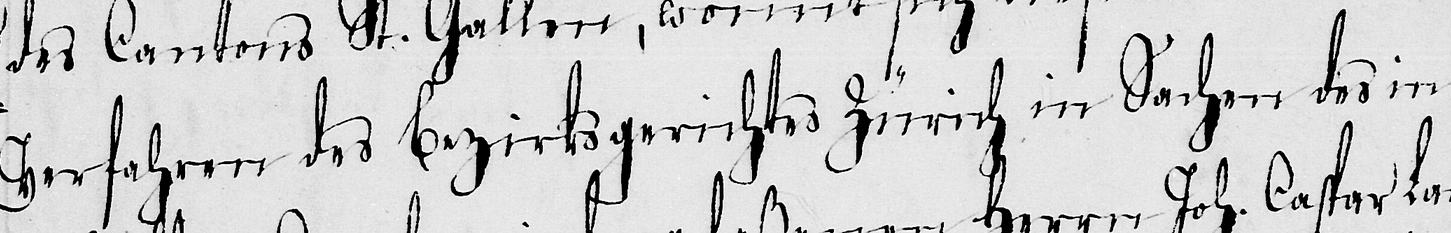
Verfahren des Bezirksgerichtes Zürich in Sachen des in
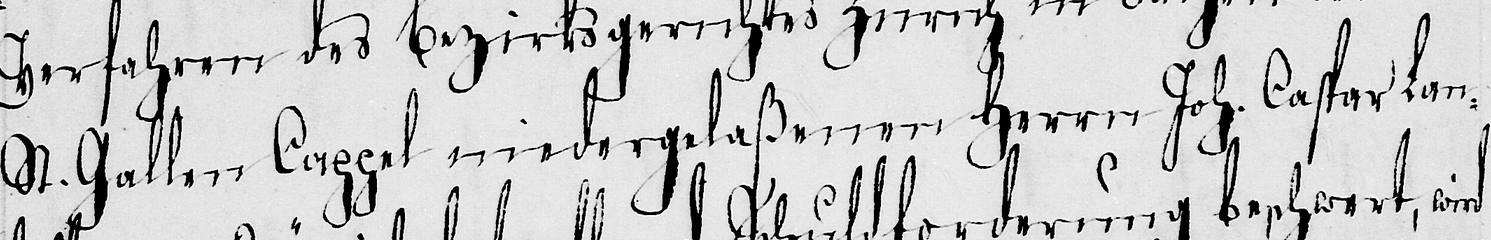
St. Gallen Cappel niedergelaßenen Herrn Joh. Caspar Lan¬
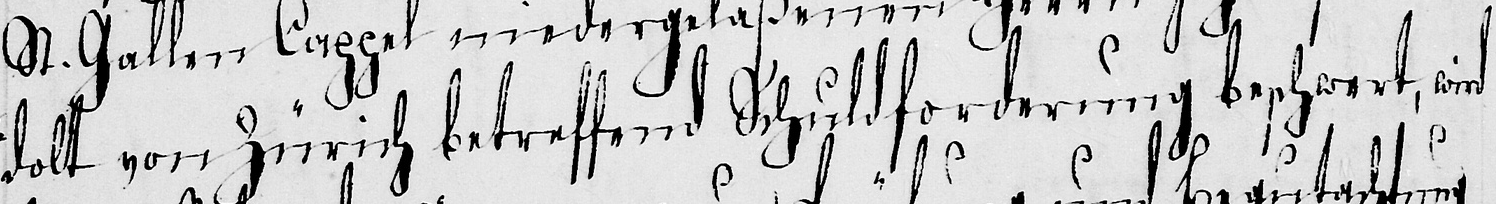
dolt von Zürich betreffend Schuldforderung beschwert, wi¬
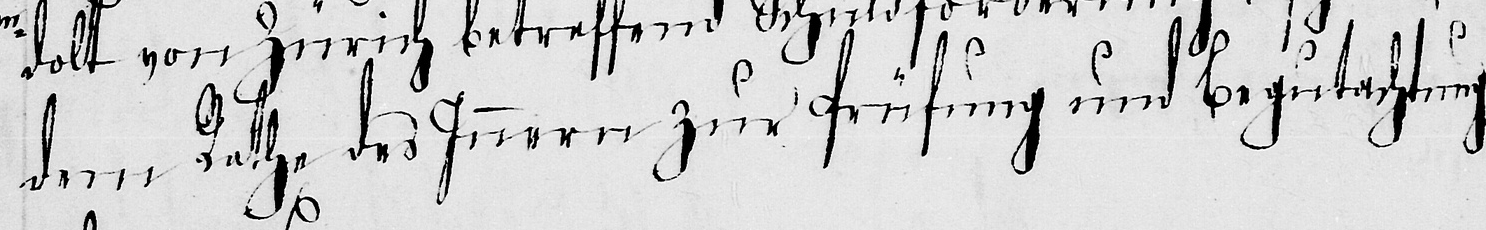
dem Rathe des Innern zur Prüfung und Begutachtung
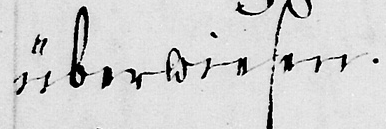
überwiesen.
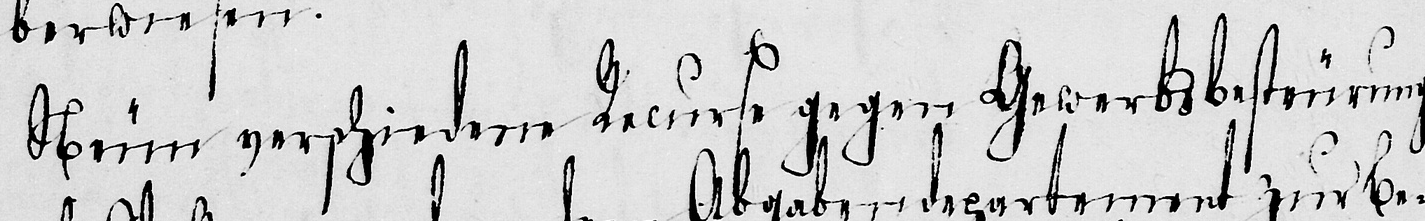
Neun verschiedene Recurse gegen Gewerbsbesteuerung
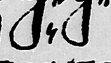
rd
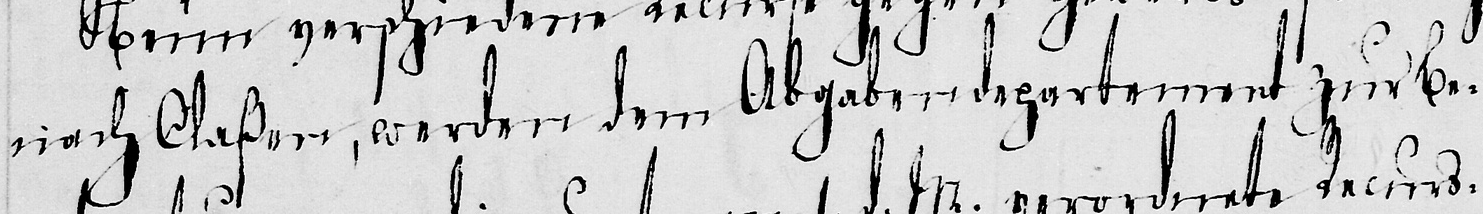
nach Claßen, werden dem Abgabendepartement zur Be¬
